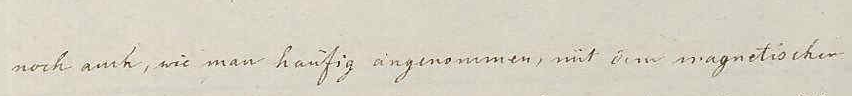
noch auch, wie man häufig angenommen, mit dem magnetischen
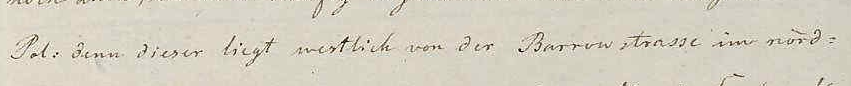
Pol: denn dieser liegt westlich von der Barrowstrasse im nörd-
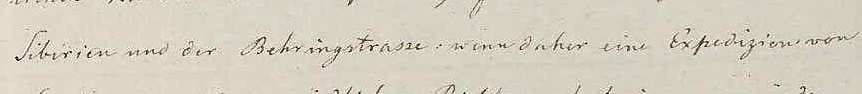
Sibirien und der Behringstrasse: wenn daher eine Expedizion von
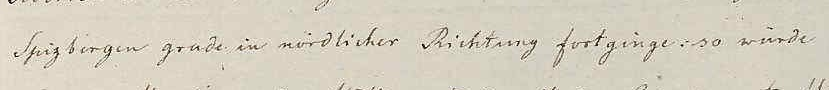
Spizbergen grade in nördlicher Richtung fortginge: so würde
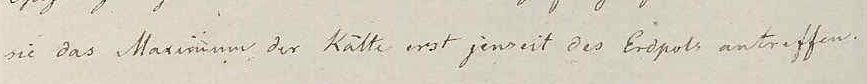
sie das Maximum der Kälte erst jenseit des Erdpols antreffen.
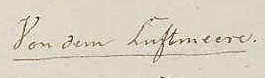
Von dem Luftmeere.
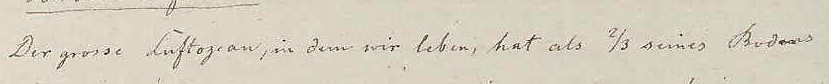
Der grosse Luftozean, in dem wir leben, hat als ⅔ seines Bodens
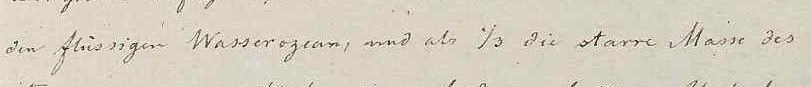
den flüssigen Wasserozean, und als ⅓ die starre Masse des
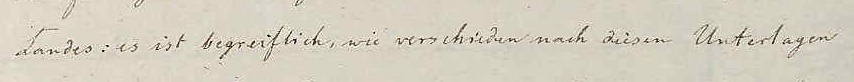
Landes: es ist begreiflich, wie verschieden nach diesen Unterlagen
